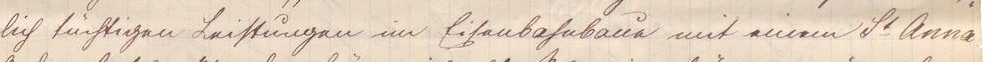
lich tüchtigen Leistungen im Eisenbahnbau mit einem St Anna-
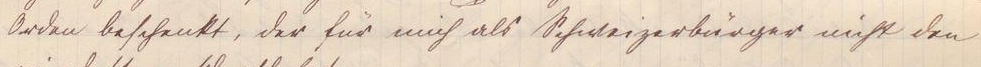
Orden beschenkt, der für mich als Schweizerbürger nicht den
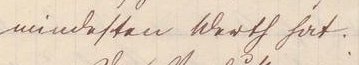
mindesten Werth hat.
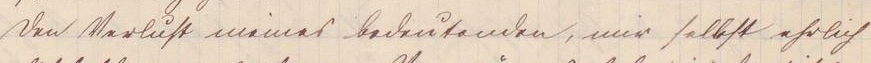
Den Verlust meines bedeutenden, mir selbst ehrlich
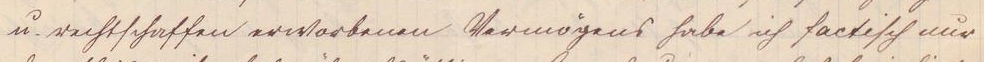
u. rechtschaffen erworbenen Vermögens habe ich factisch nur
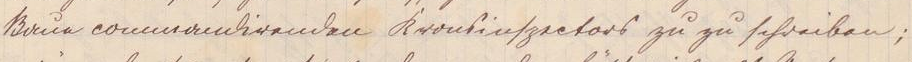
Baue commandirenden Kronsinspectors zu zu schreiben;
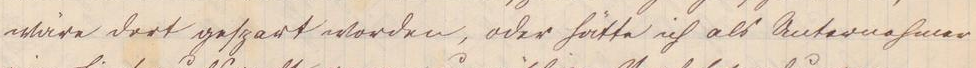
wäre dort gespart worden, oder hätte ich als Unternehmer
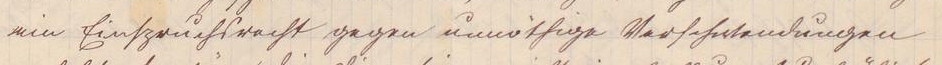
ein Einspruchsrecht gegen unnöthige Verschwendungen
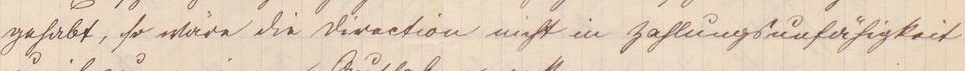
gehabt, so wäre die Direction nicht in Zahlungsunfähigkeit
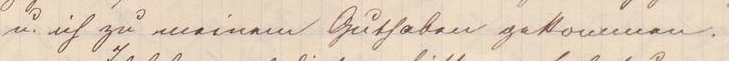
u. ich zu meinem Guthaben gekommen.
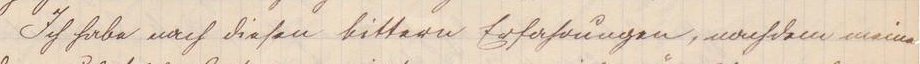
Ich habe nach diesen bittern Erfahrungen, nachdem meine
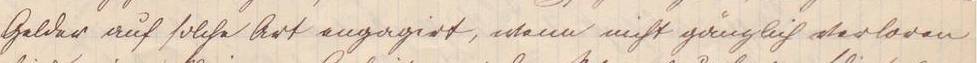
Gelder auf solche Art engagirt, wenn nicht gänzlich verloren
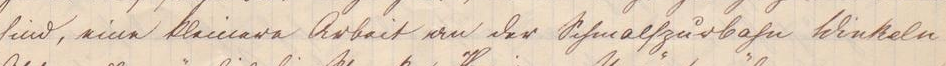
sind, eine kleinere Arbeit an der Schmalspurbahn Winkeln–
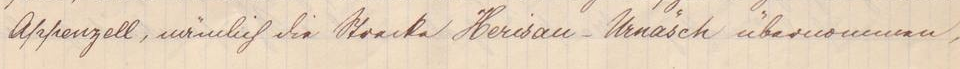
Appenzell, nämlich die Strecke Herisau–Urnäsch übernommen,
